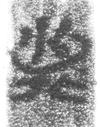若
